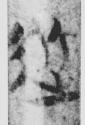從
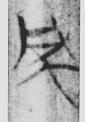風
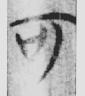可
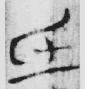氏（是）
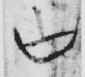古（故）
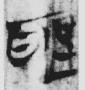聖
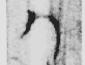人
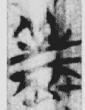兼
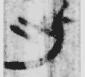此
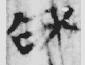和
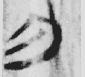勿（物）
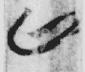㠯（以）
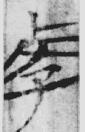李（理）
